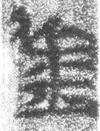○（錦）
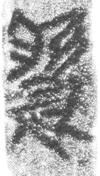○（韜）
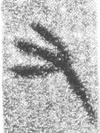又（有）
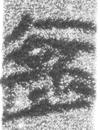盍（蓋）
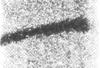一
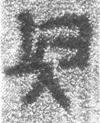長
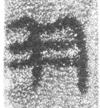羽
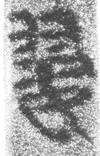翣
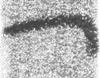一
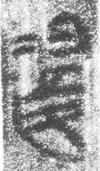翣
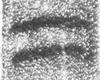二
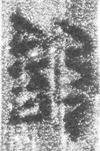竹翣
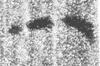一
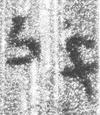竹
